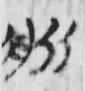斨
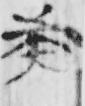族
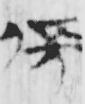倀
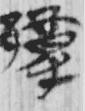○（复）
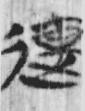連
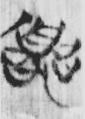囂
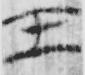壬
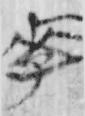李
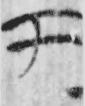于
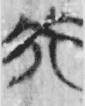癸
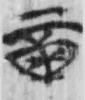酉
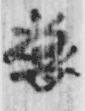喜
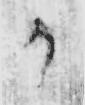人
